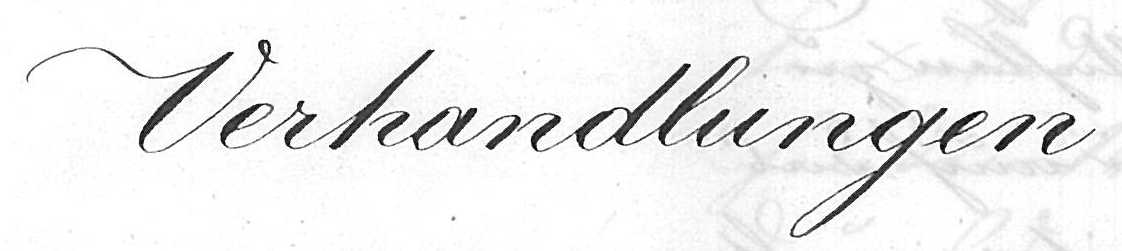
Verhandlungen
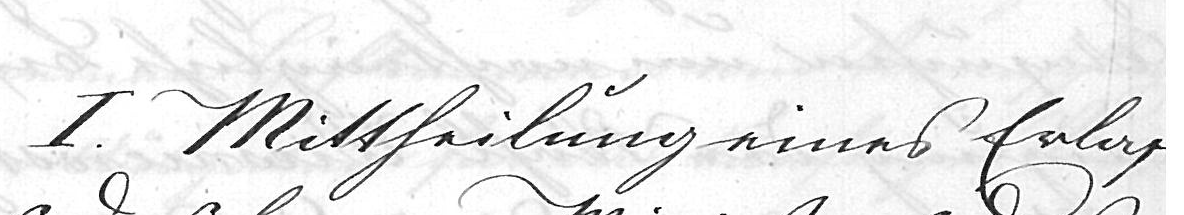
I. Mittheilung eines Erlas-
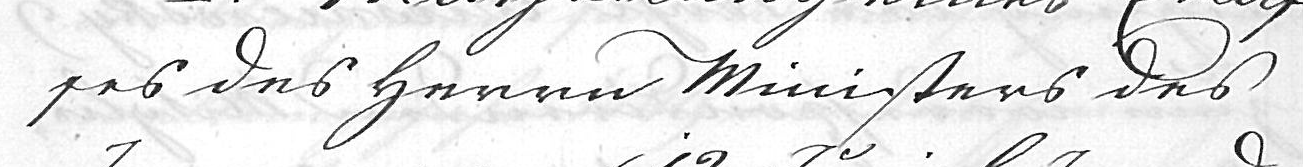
ses des Herrn Minister des
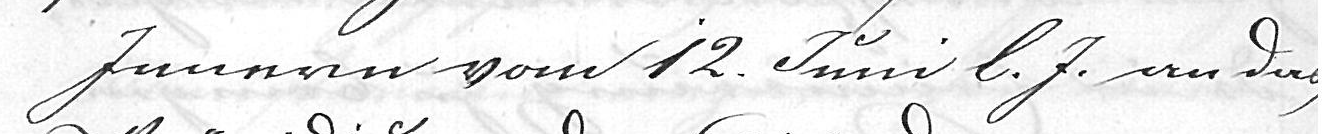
Innern vom 12. Juni l.J., an das
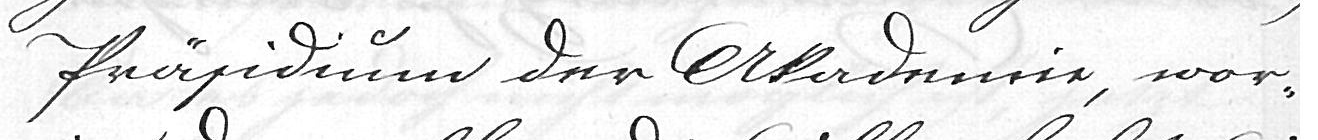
Präsidium der Akademie, wor-
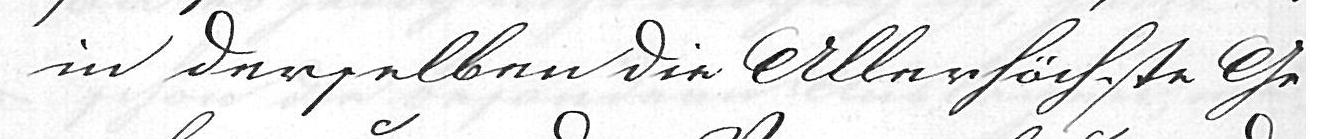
in derselben die Allerhöchste Ge-
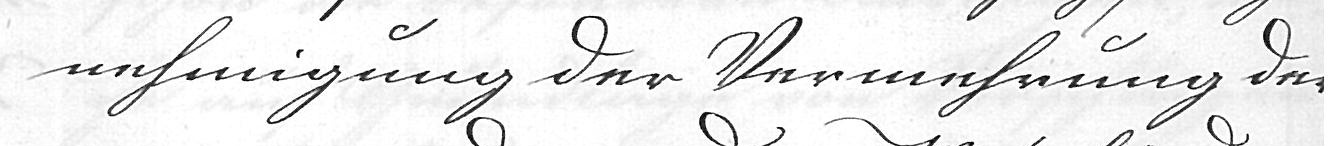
nehmigung der Vermehrung der
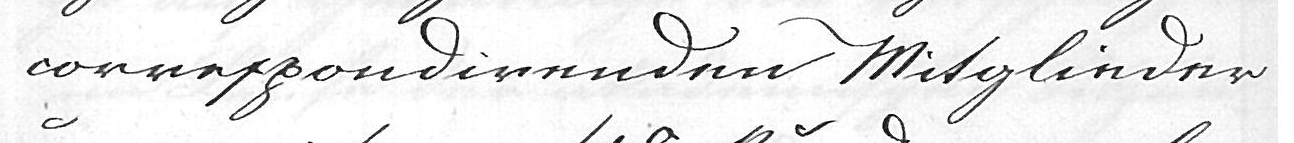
correspondirenden Mitglieder
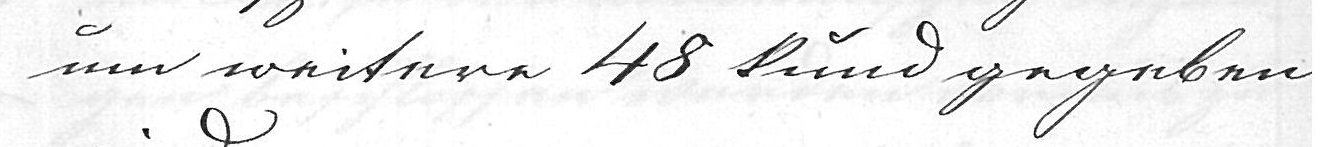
um weitere 48 kund gegeben
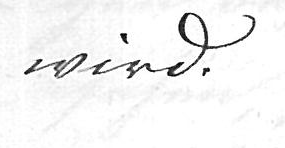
wird.
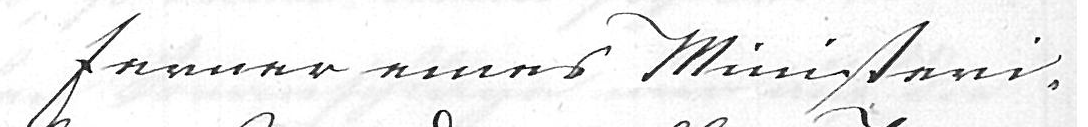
Ferner eines Ministeri-
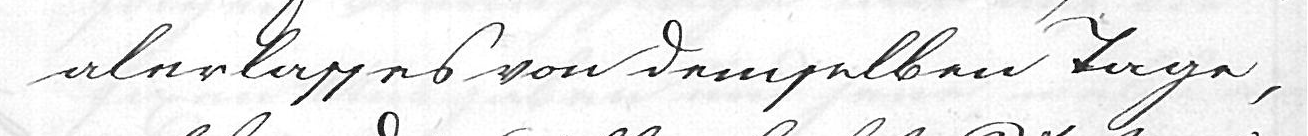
alerlasses von demselbenTage,
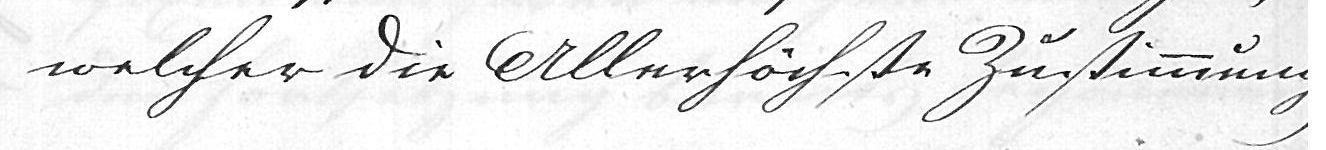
welcher die Allerhöchste Zustimmung
